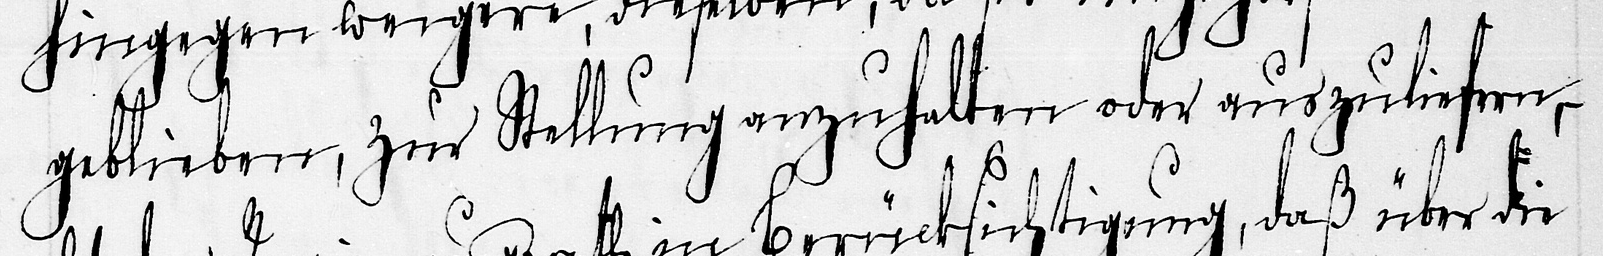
geblieben, zur Stellung anzuhalten oder auszuliefern,
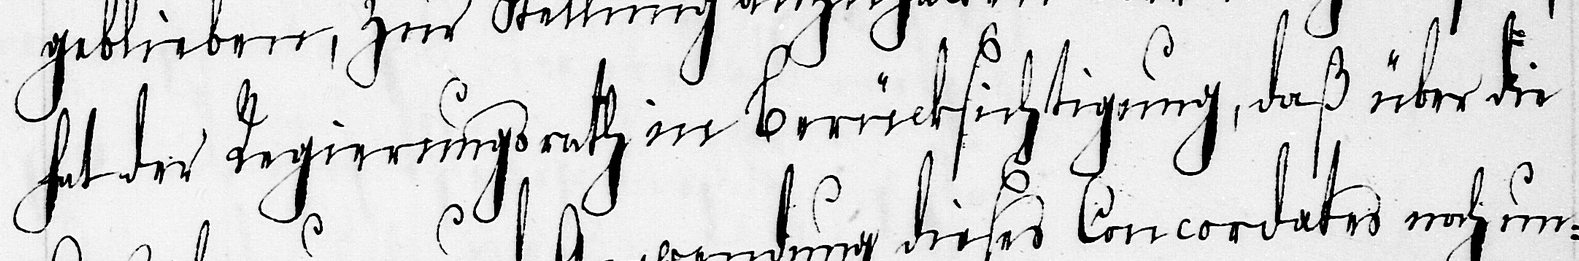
hat der Regierungsrath in Berücksichtigung, daß über die
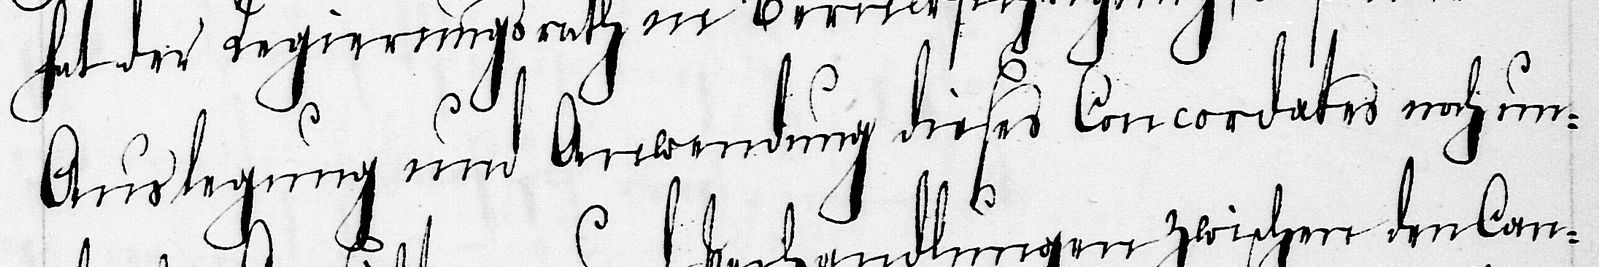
Auslegung und Anwendung dieses Concordates noch un¬
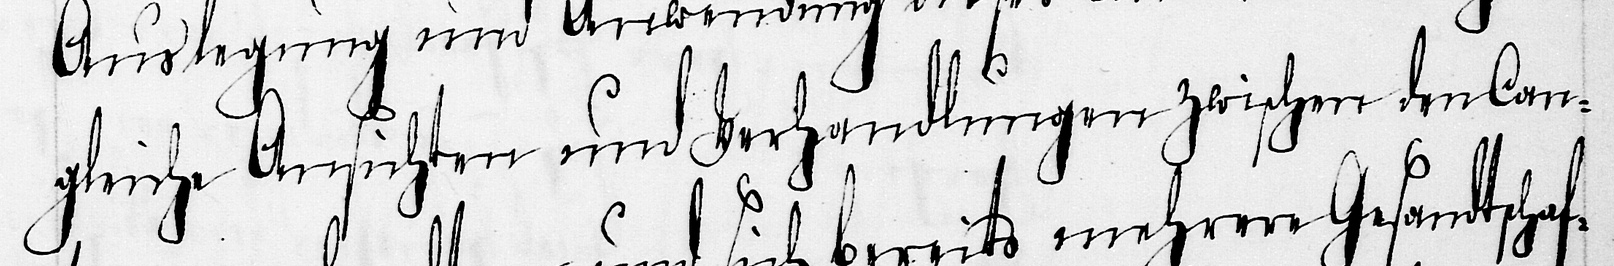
gleiche Ansichten und Verhandlungen zwischen den Can¬
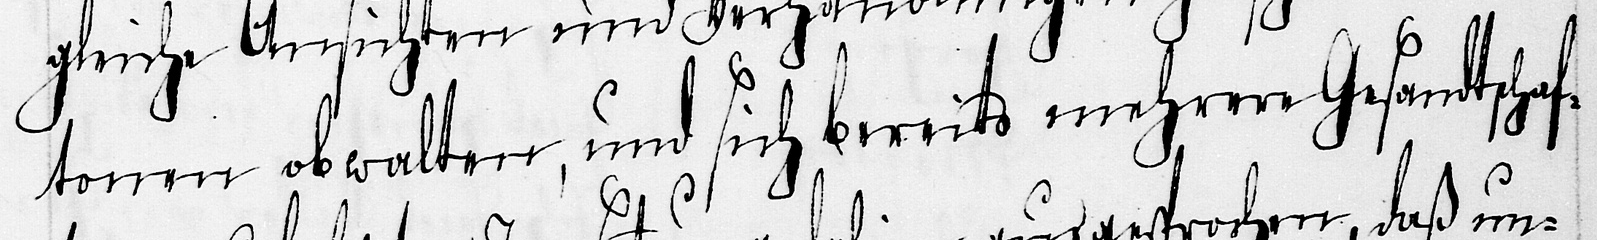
tonen obwalten, und sich bereits mehrere Gesandtscha¬
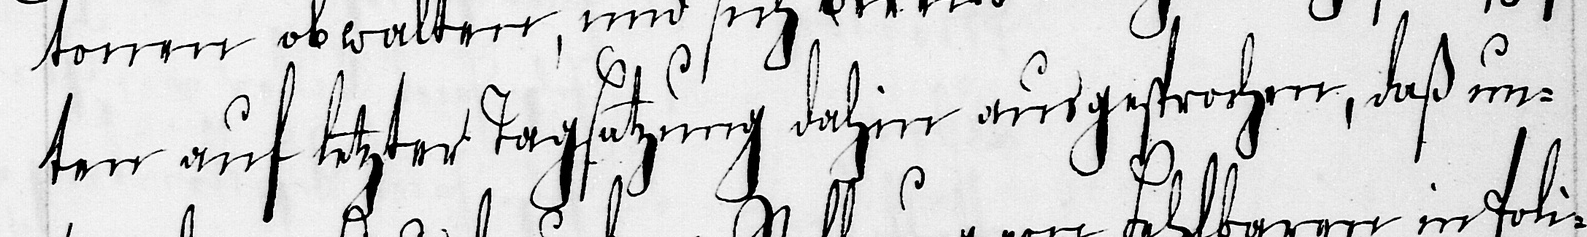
ften auf letzter Tagsatzung dahin ausgesprochen, daß un¬
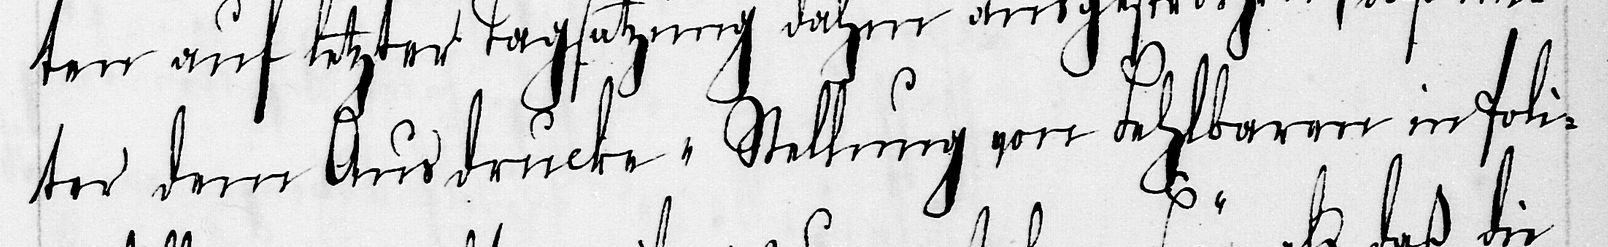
ter dem Ausdrucke „Stellung von Fehlbaren in Polic¬
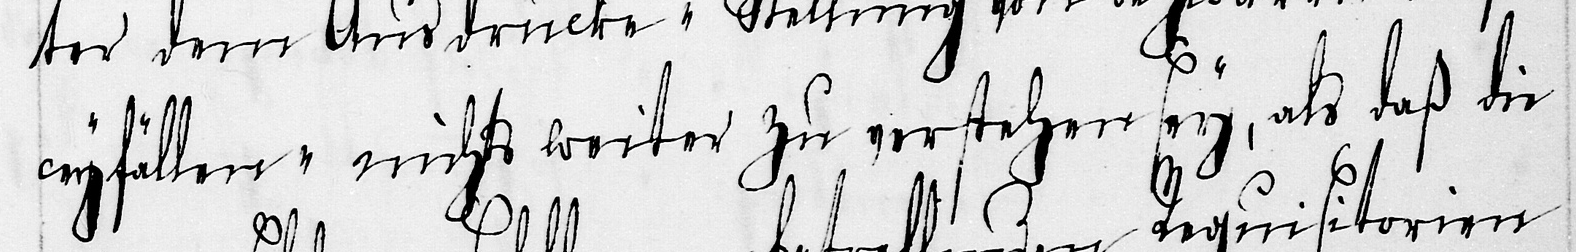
eyfällen“ nichts weiter zu verstehen sey, als daß die
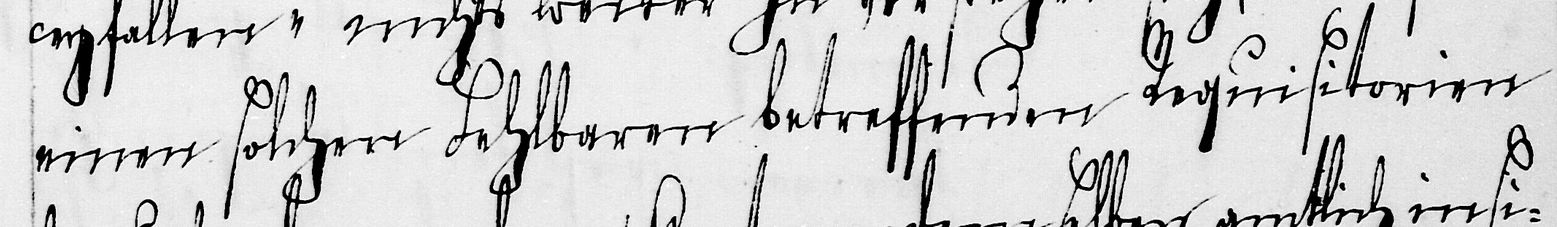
einen solchen Fehlbaren betreffenden Requisitorien
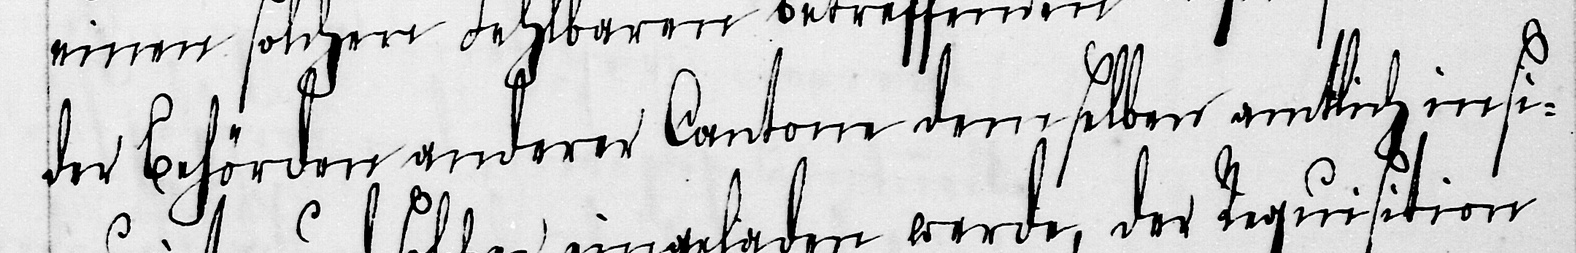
der Behörden anderer Cantone demselben amtlich insi¬
